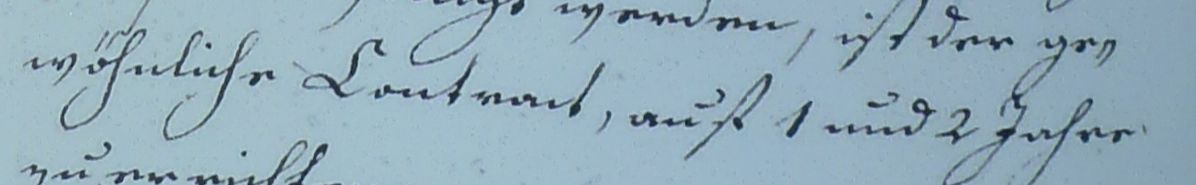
wöhnliche Contract, auf 1 und 2 Jahre
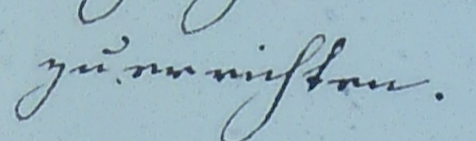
zu errichten.
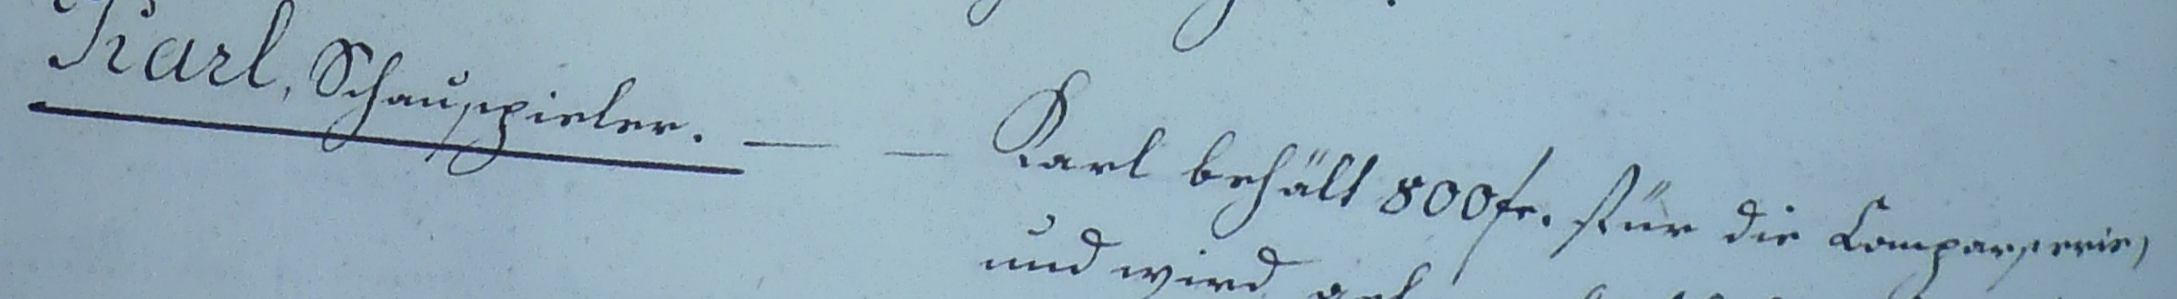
Karl, Schauspieler. _ _ Karl behält 800fr. für die Comparserie,
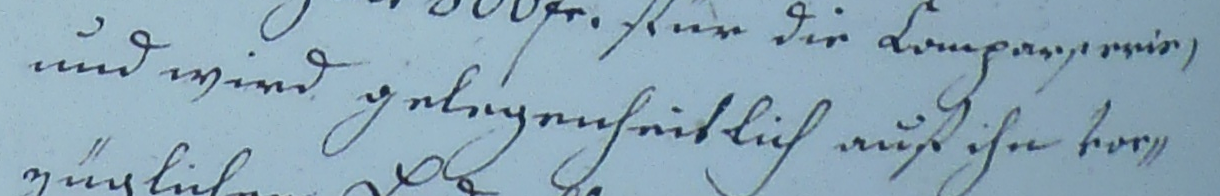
und wird gelegenheitlich auf ihn vor¬
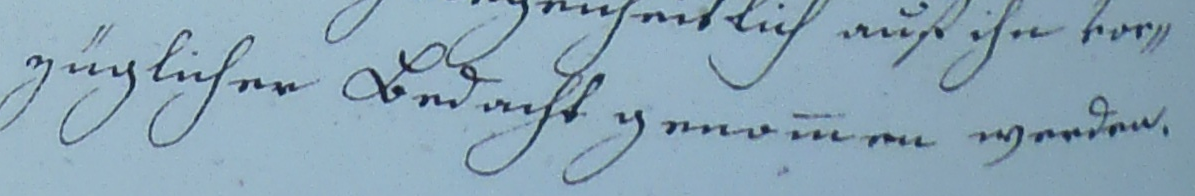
züglicher Bedacht genomen werden.
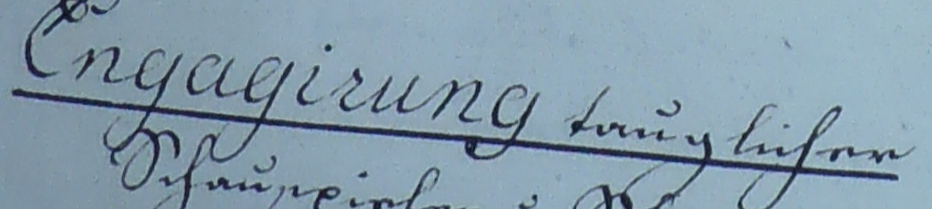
Engagirung tauglicher
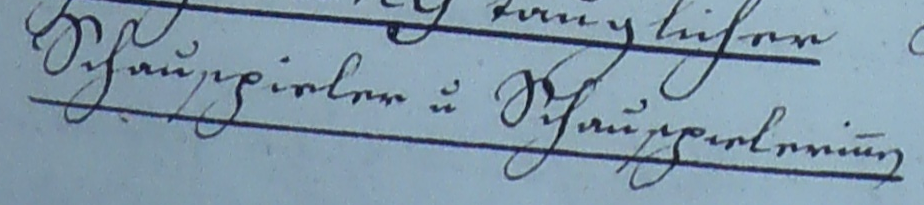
Schauspieler u Schauspielerin̅en
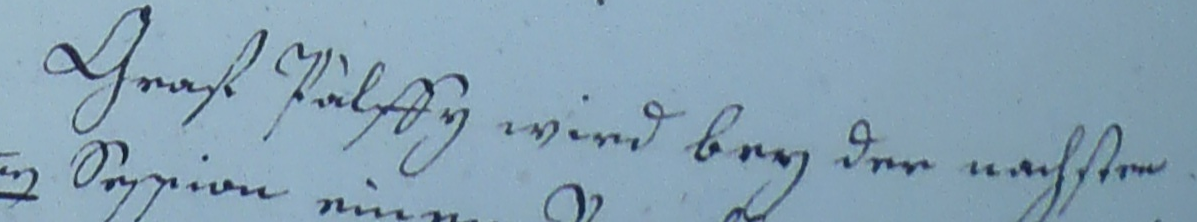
Graf Pàlffy wird bey der nachsten
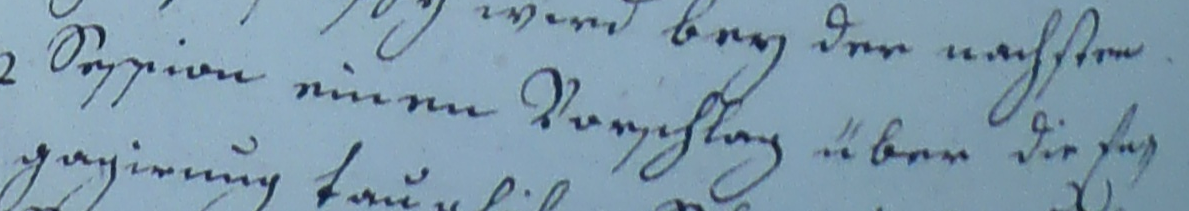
Session einen Vorschlag über die En¬
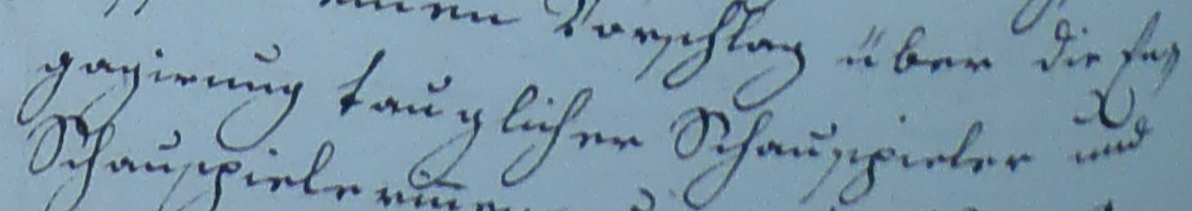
gagirung tauglicher Schauspieler und
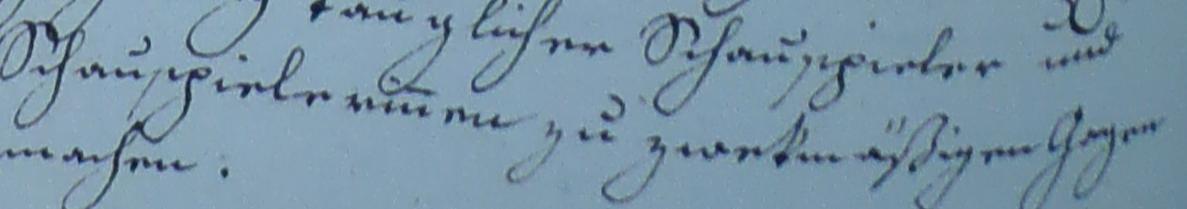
Schauspielerin̅en zu zwekmäßigen Gagen
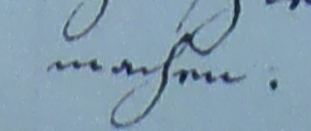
machen.
